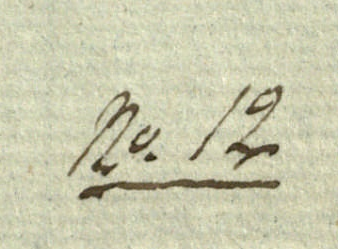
. Sr.
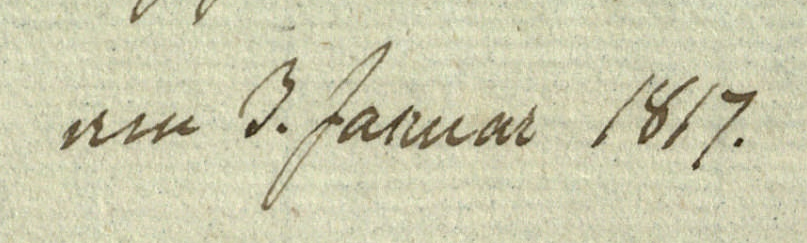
am 3. Januar 1817.
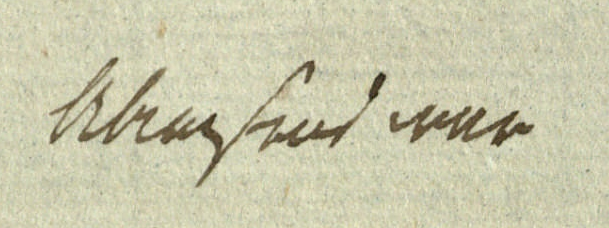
Abwesend war
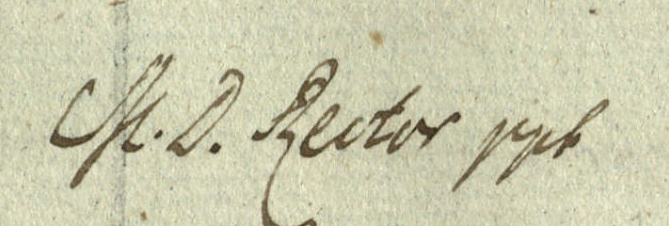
M. D. Rector pt
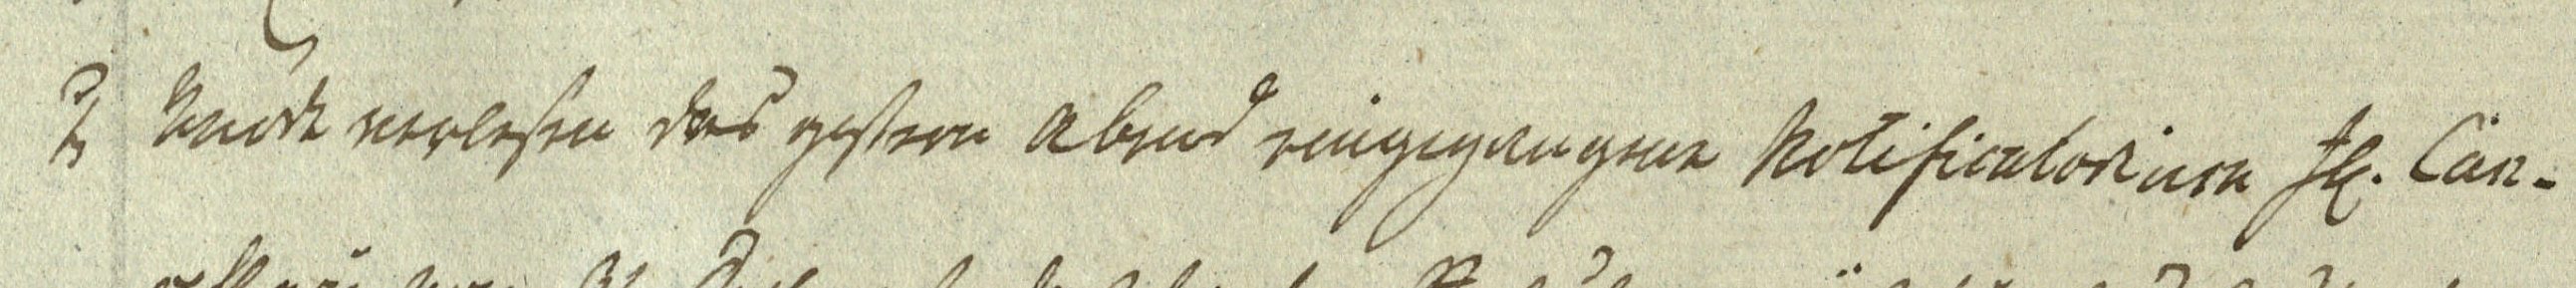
M. Wurde verlesen das gestern Abend eingegangene Notificatorium Il. Can¬
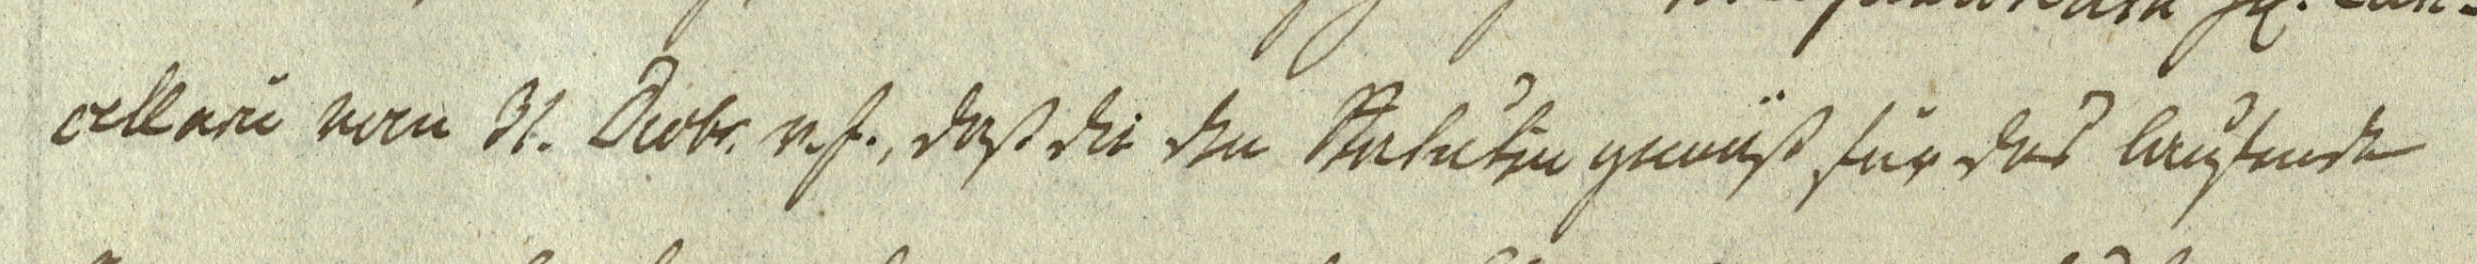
aller vom 1. Decbr. dh., daß die den Statuten gewußt für des laufende
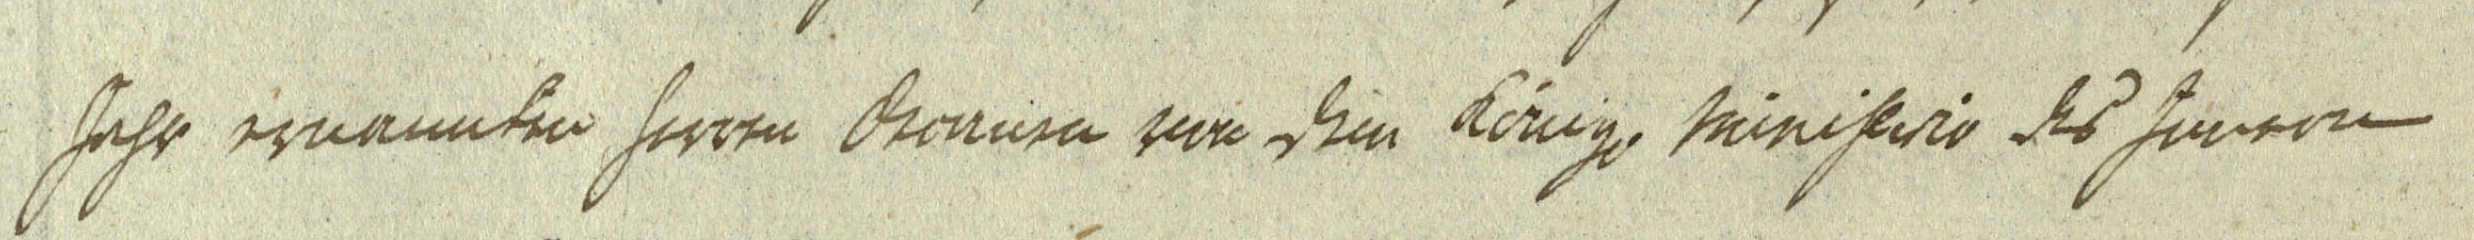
Jahr ernannten Herren Decanen von dem Königl. Ministerio des hierin
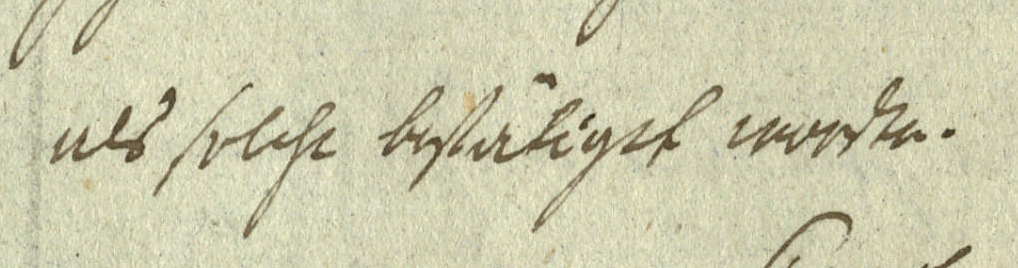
als solche bestätiget worden.
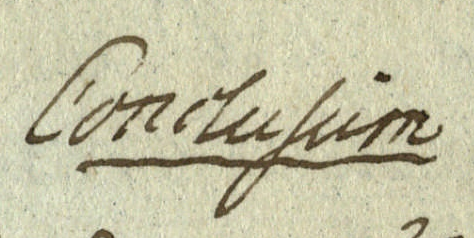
Con lassen
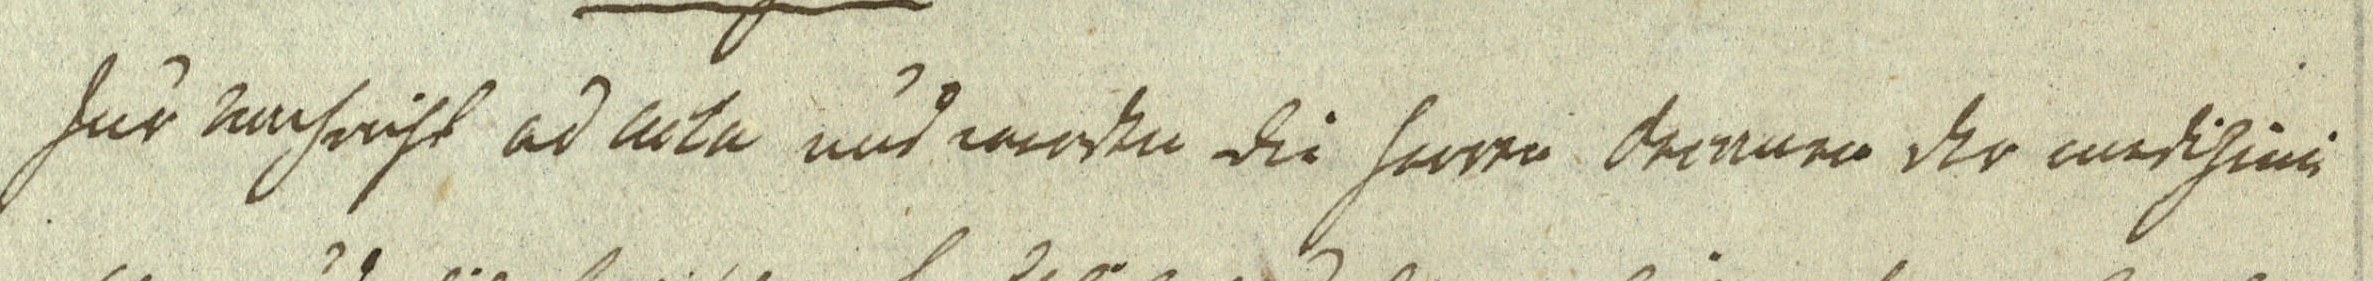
zur Nachricht ad Acta und werden die Herren Decanen der medkhini
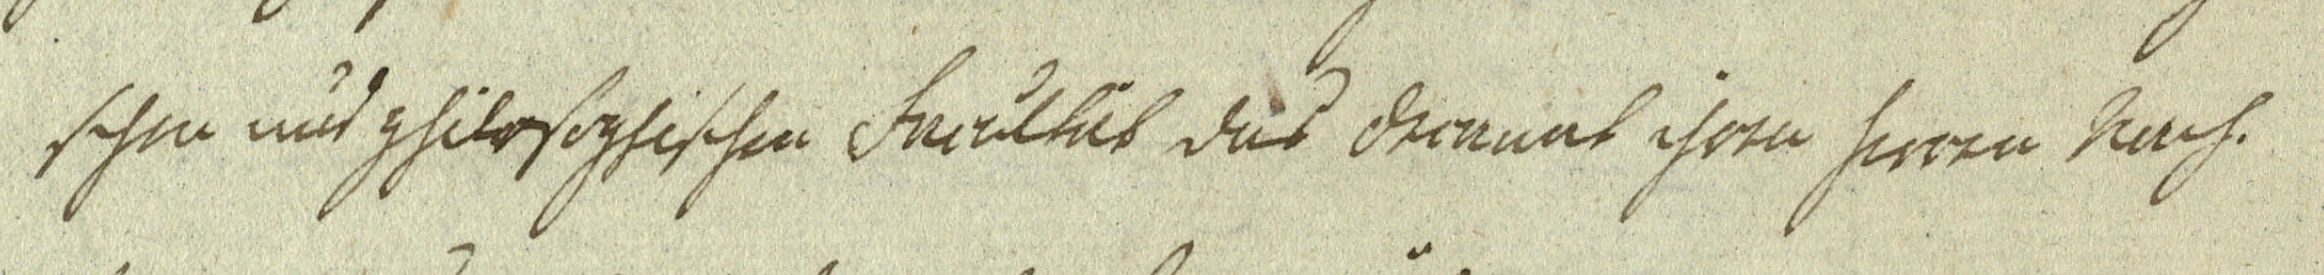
schon und philosophischen Facultät das Decanat ihren Herren auch.
